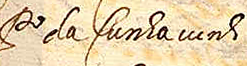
Po da Cunha cunh
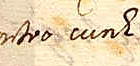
outro cunh
